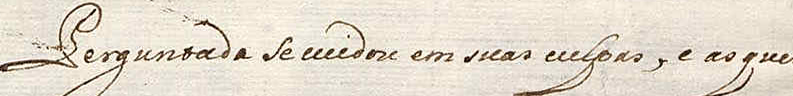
Perguntada se cuidou em suas culpas, e as quer
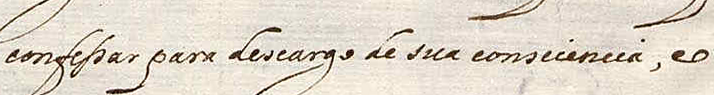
confessar para descargo de sua consciencia, e
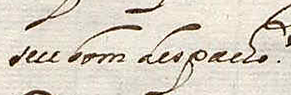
seu bom despacho.
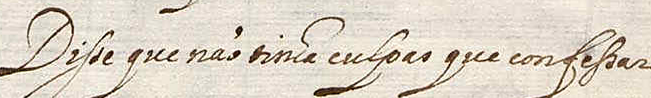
Disse que não tinha culpas que confessar
